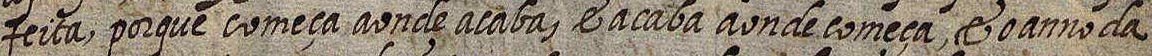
feita, porque começa aonde acaba, E acaba aonde começa, & o anno da
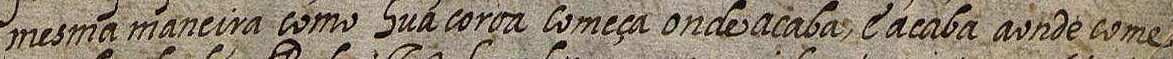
mesma maneira como huā coroa começa onde acaba, e acaba aonde come
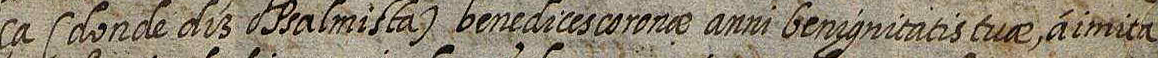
ça (donde diz o Psalmista) benedicescoronæ anni benignitatis tuæ, á imita
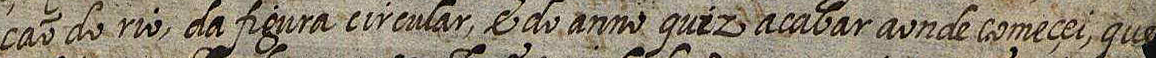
caõ do rio, da figura circular, e do anno quiz acabar aonde começei, que
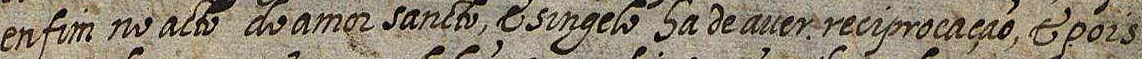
enfim no acto do amor sancto, e singelo ha de auer recriprocaçaõ, & pois
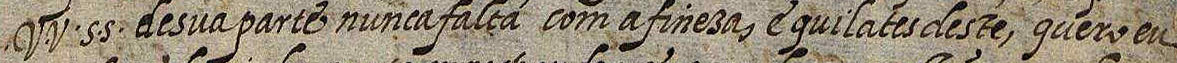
.V.V. s.s. de sua parte nunca faltā com a fineza, e quilaes deste, quero eu
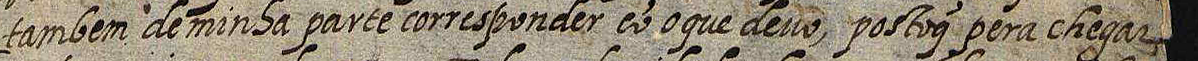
tambem de minha parte corresponder cō o que deuo, posto q̄ pera chegar
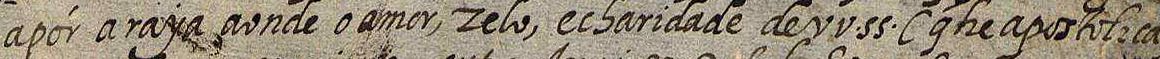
a pór a raya aonde o amor, zelo, e charidade de vv.ss. (q̄ he apostolica)
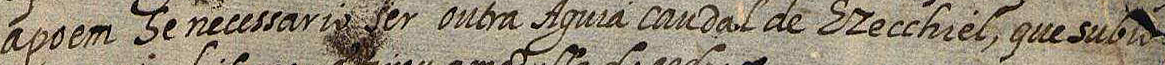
a poem he necessario ser outra Aguia caudal de Ezecchiel, que subio
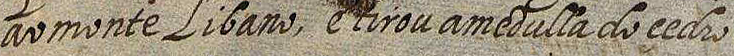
ao monte Libano, e tirou a medulla do çedro
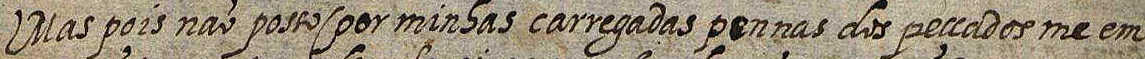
Mas pois naõ posso (por minhas carregadas pennas dos peccados me em
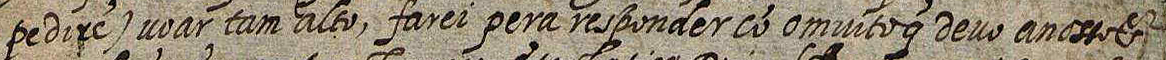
pedirē) uoar tam alto, farei pera responder cō o muito q̄ deuo a nosso sor
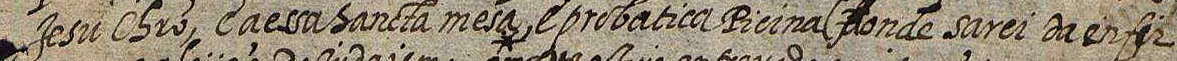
Jesu Chrō, e a essa Sancta mesa, e probatica Picina (aonde sarei da enfer
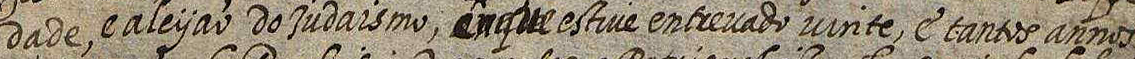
dade e aleijaõ do judaísmo, en que estiue entreuado uinte, e tantos annos
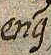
en q̄
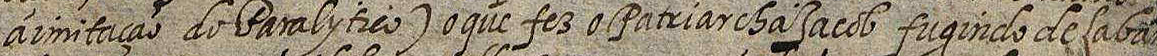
á imitação do Paralytico) o que fez o Patriarcha Jacob fugindo de Laba
